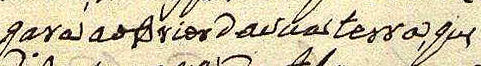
gara ao Prior da sua terra, qui
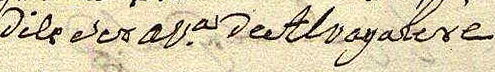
dice ser a V.a de Alvayazere
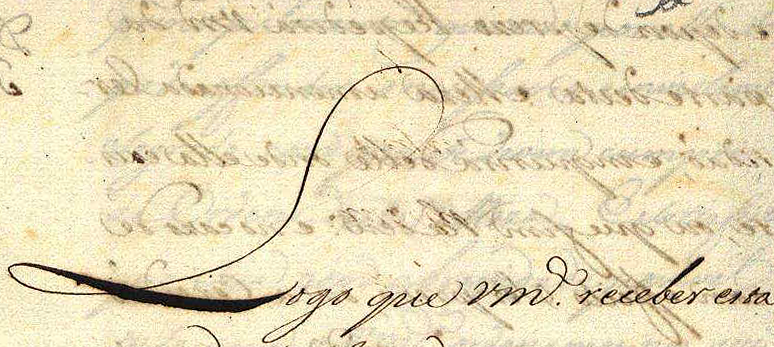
Logo que v m.e receber esta
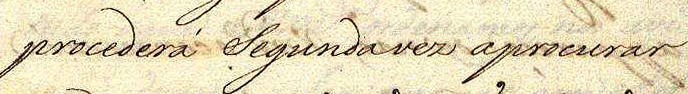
procederá Segunda vez a procurar
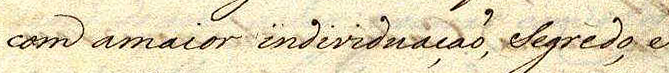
com a maior individuaçaõ, segredo, e
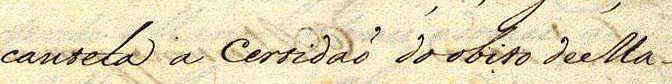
cautela a certidaõ do obito de Ma
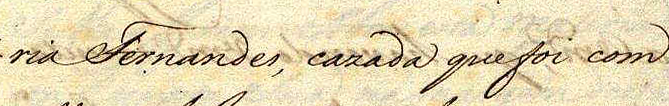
ria Fernandes cazada que foi com
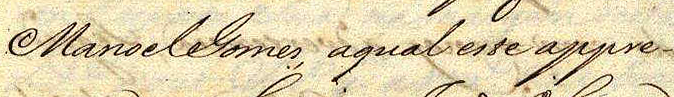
Manoel Gomes, a qual este appre
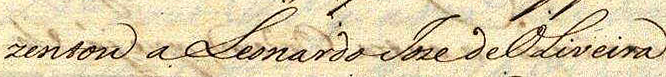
zentou a Leonardo Ioze de OLiveira
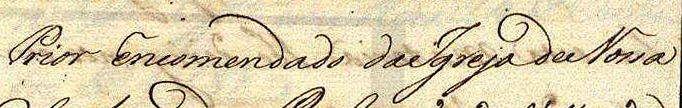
Prior Encomendado da Igreja de Nossa
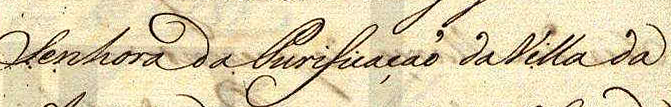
Senhora da Purificaçaõ da Villa da
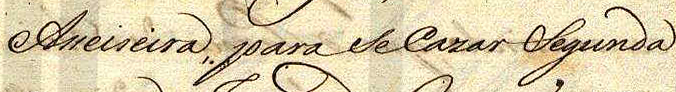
Asseireira, para se cazar Segunda
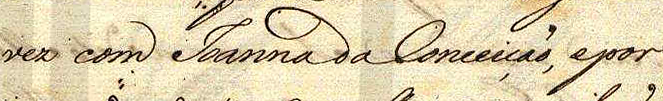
vez com Ioanna da Conceiçaõ, e por
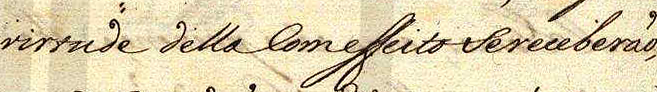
virtude della com effeito se receberaõ,
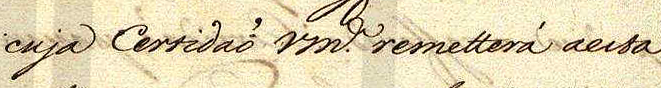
cuja certidaõ v m.e remetterá a esta
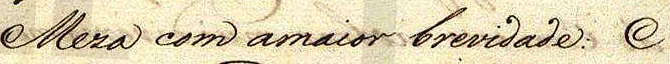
Meza com a maior brevidade. e
